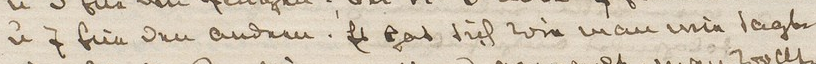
u 7 für den andern. Es hat sich wie man mir sagte
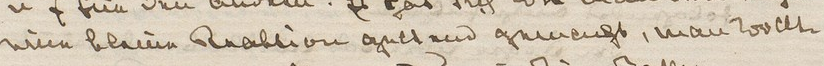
eine kleine Reaktion geltend gemacht, man wollte
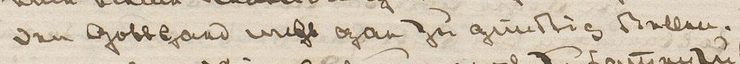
den Gotthard nicht gar zu günstig stellen.
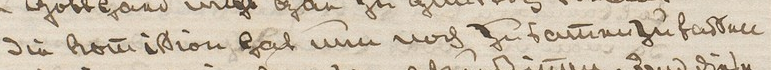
Die Kommission hat nun noch zusammenzufassen
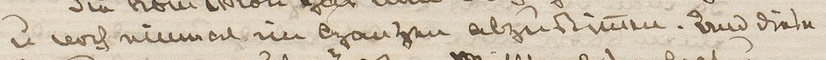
u noch einmal im Ganzen abzustimmen. Und diese
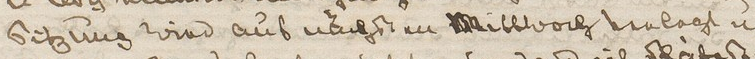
Sitzung wird auf nächsten Mittwoch verlegt u
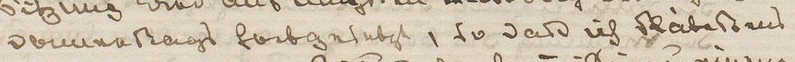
Donnerstags fortgesetzt, so daß ich spätestens
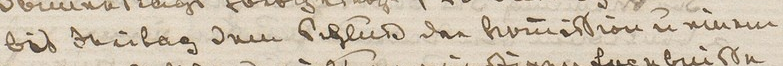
bis Freitag dem Schluß der Kommission u einem
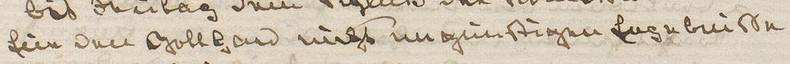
für den Gotthard nicht ungünstigen Ergebnisse
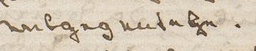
entgegensehe.
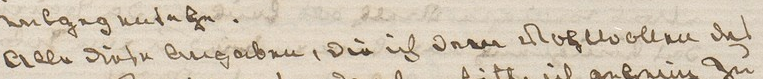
Alle diese Angaben, die ich dem Wohlwollen des
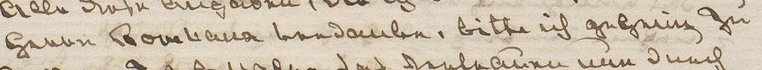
Herrn Rombaux verdanke, bitte ich geheim zu
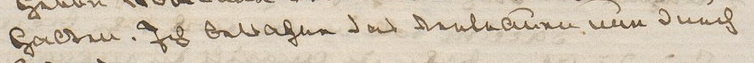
halten. Ich bewahre das Vertrauen nur durch
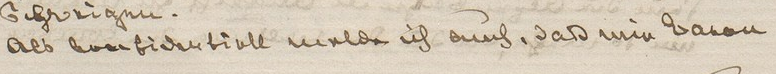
Als konfidentiell melde ich auch, daß mir Baron
